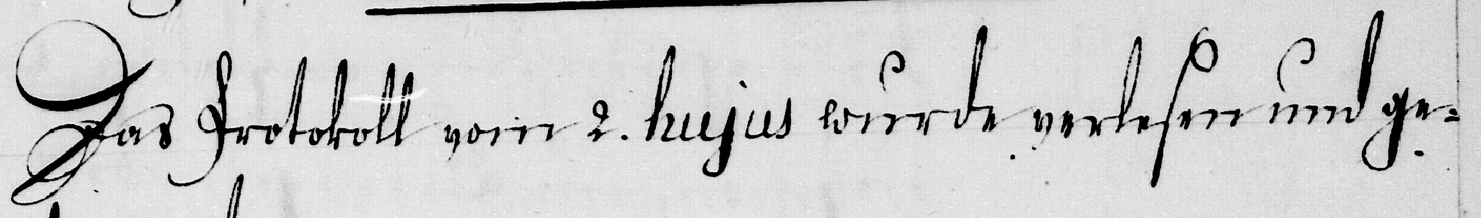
Das Protokoll vom 2. hujus wurde verlesen und ge¬
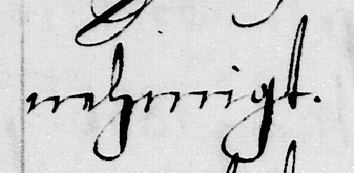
nehmigt.
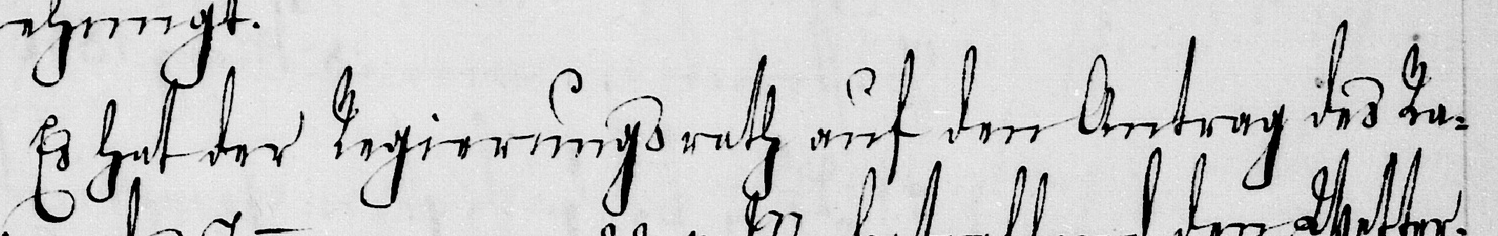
Es hat der Regierungsrath auf den Antrag des Ra¬
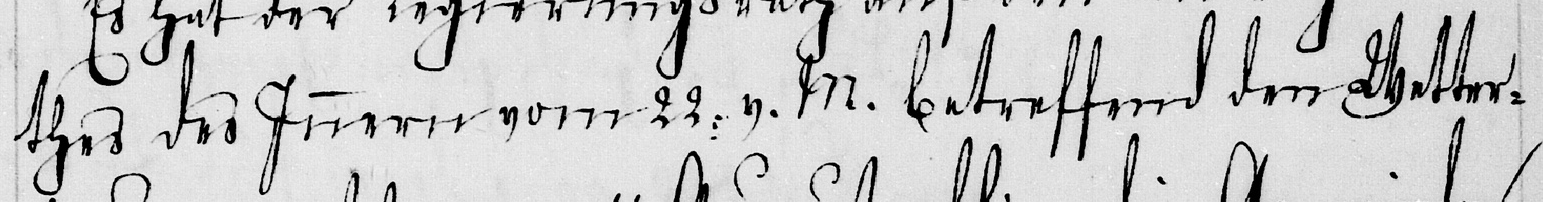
thes des Innern vom 22. v. M. betreffend den Wetter¬
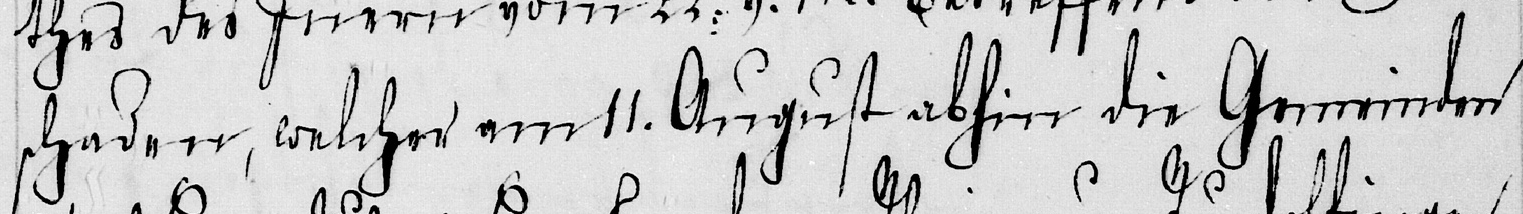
schaden, welcher am 11. August abhin die Gemeinden
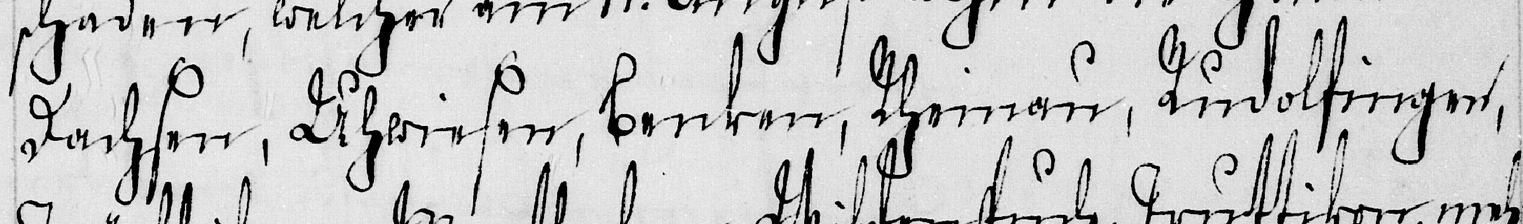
Dachsen, Uhwiesen, Benken, Rheinau, Rudolfingen,
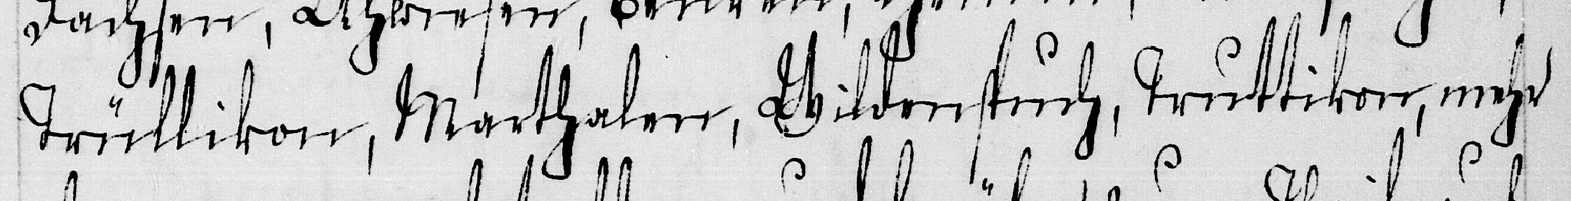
Trüllikon, Marthalen, Wildenspuch, Truttikon, mehr
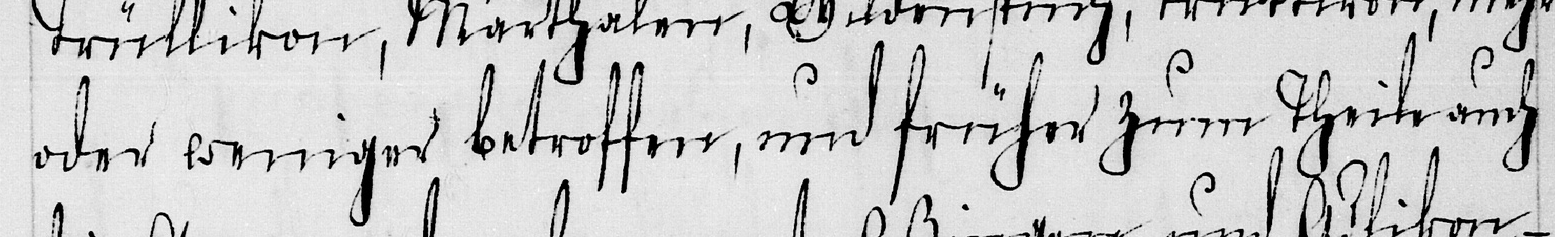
oder weniger betroffen, und früher zum Theile auch
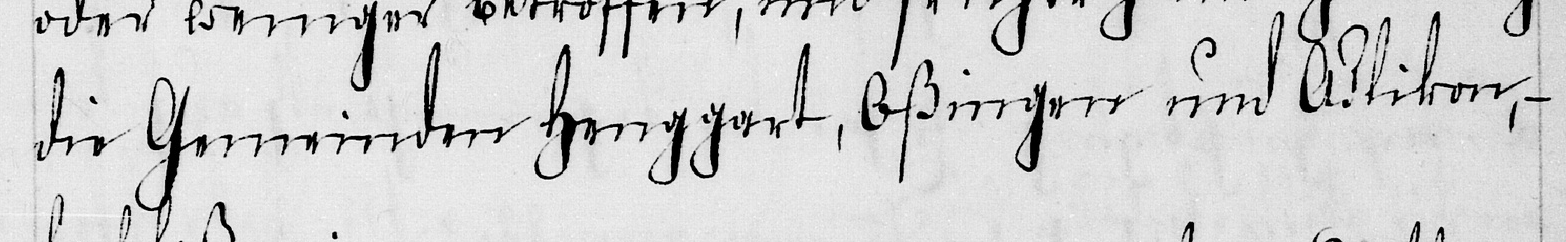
die Gemeinden Henggart, Oßingen und Adlikon,
